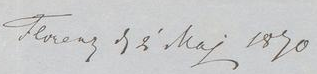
Florenz d 2t Mai 1870.
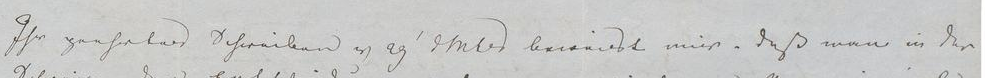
Ihr geehrtes Schreiben vom 29t dMts beweist mir, daß man in der
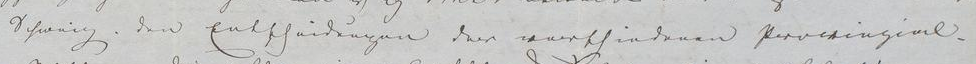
Schweiz den Entscheidungen der verschiedenen Provinzial-
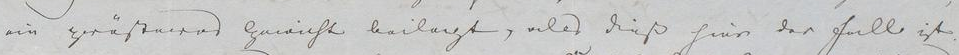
ein größeres Gewicht beilegt, als dieß hier der Fall ist.
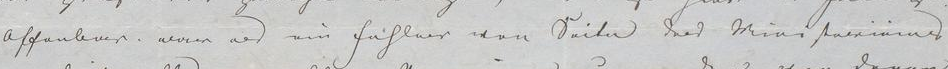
Offenbar war es ein Fehler von Seite des Ministeriums
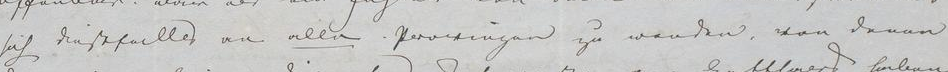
sich dießfalls an alle Provinzen zu wenden, von denen
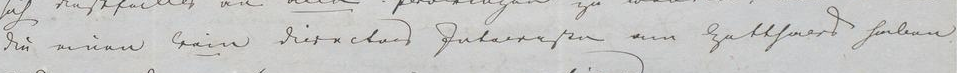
die einen kein directes Intereße am Gotthard haben
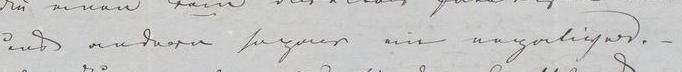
und andere sogar ein negatives. –
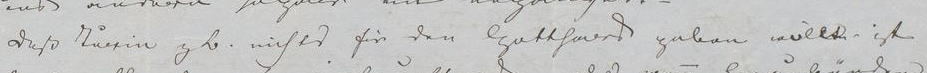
Daß Turin z. B. nichts für den Gotthard geben wollte, ist
